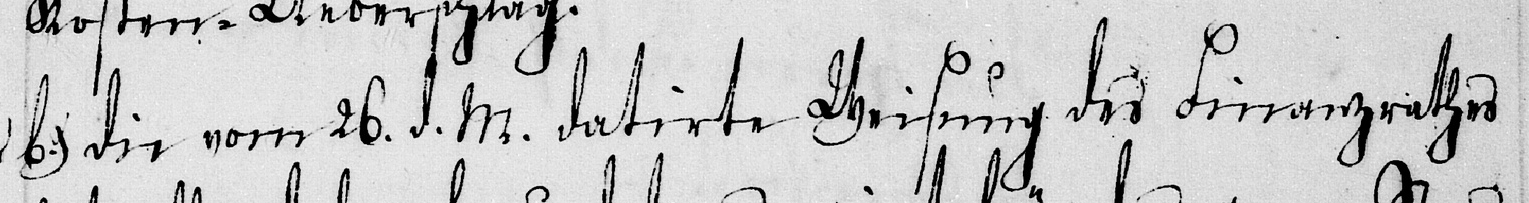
b.) die vom 26. d. M. datirte Weisung des Finanzrathes
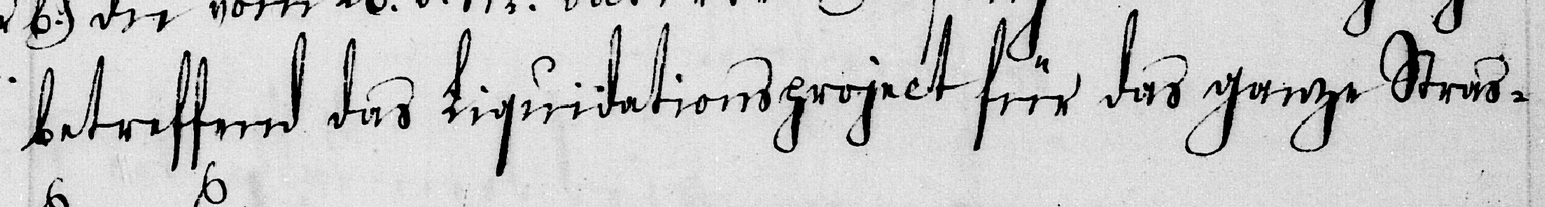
betreffend das Liquidationsproject für das ganze Stra¬
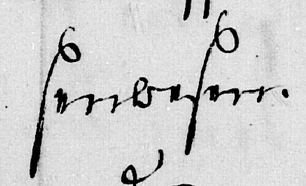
ßenwesen.
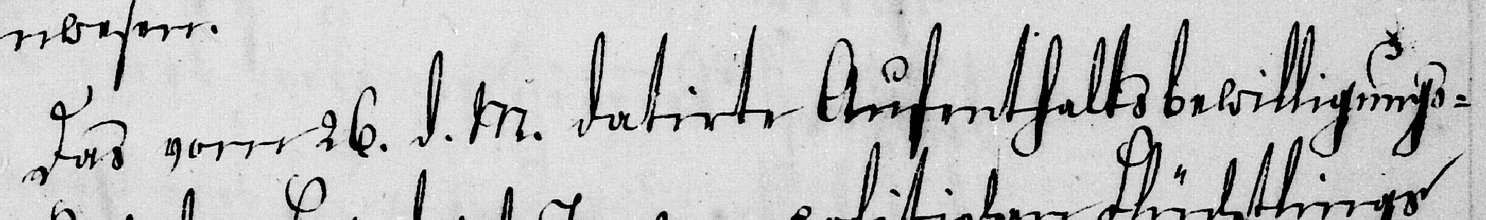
Das vom 26. d. M. datirte Aufenthaltsbewilligungs¬
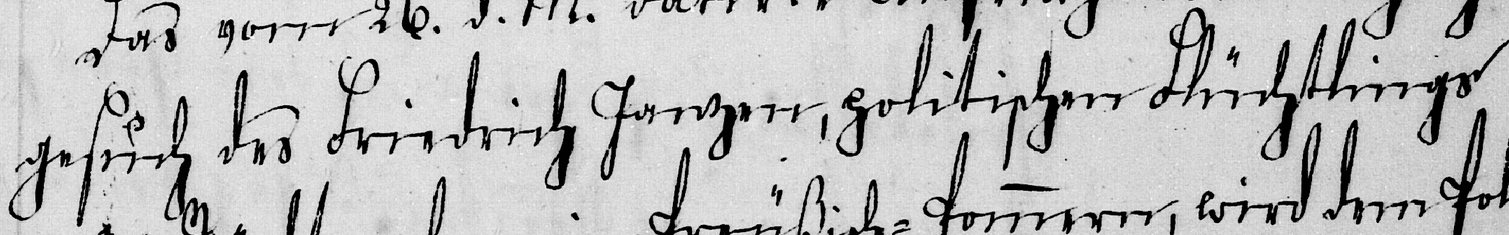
gesuch des Friedrich Janzen, politischen Flüchtlings
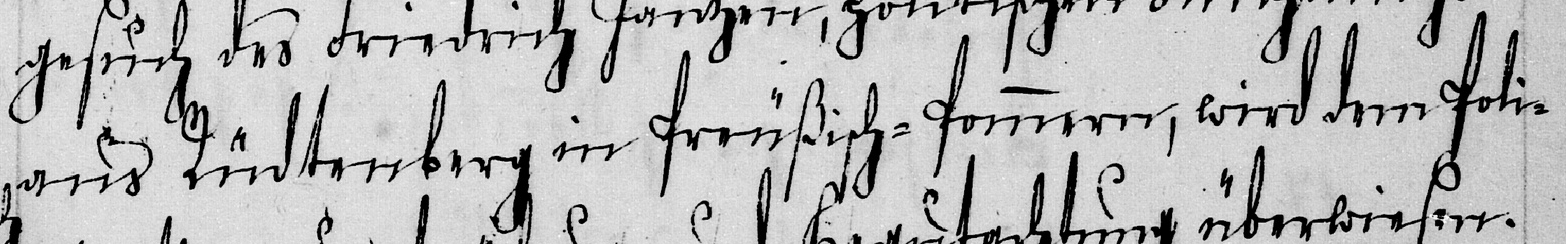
aus Rüdtenberg in Preußisch-Pommern, wird dem Poli¬
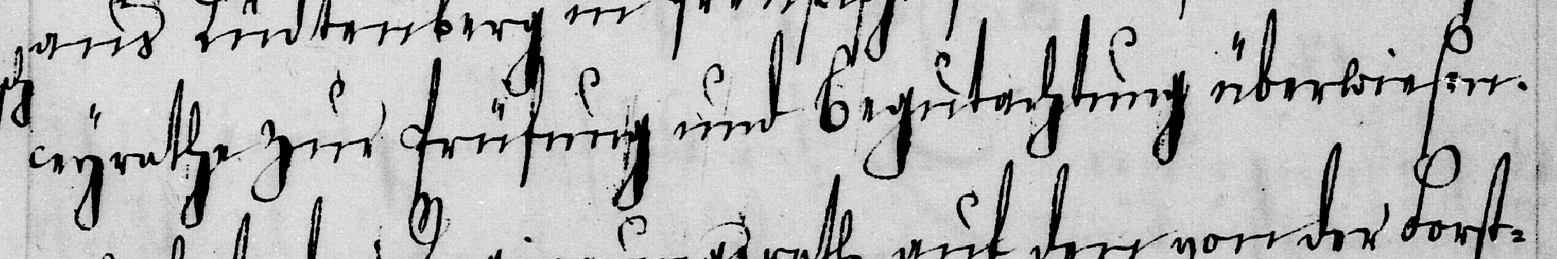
ceyrathe zur Prüfung und Begutachtung überwiesen.
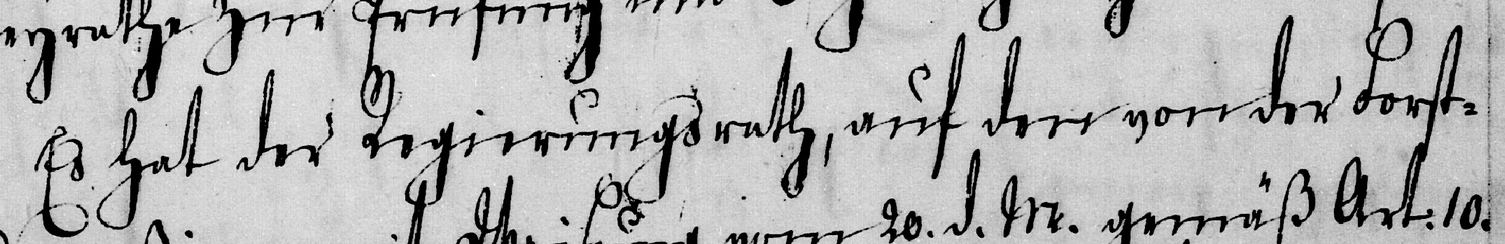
Es hat der Regierungsrath, auf den von der Fors¬
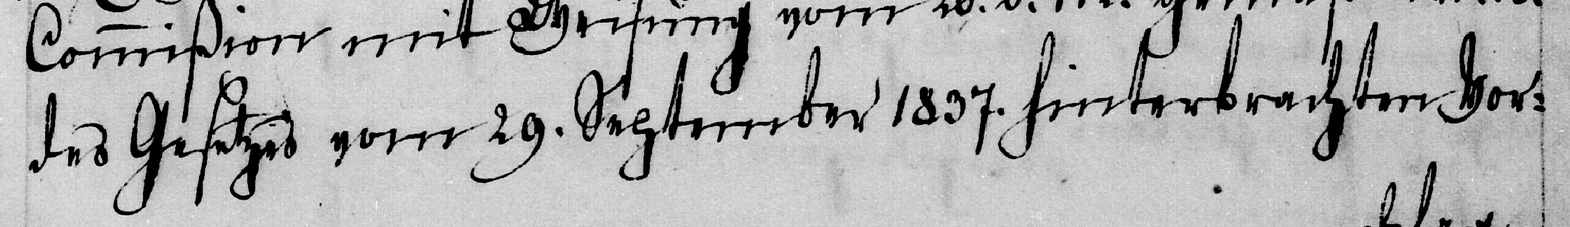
des Gesetzes vom 29. September 1837. hinterbrachten Vor-
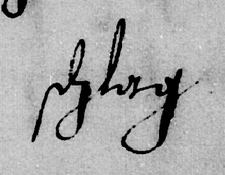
schlag¬
